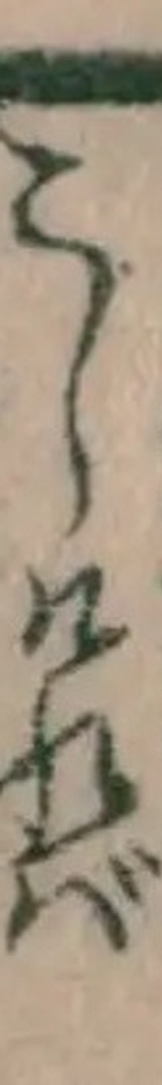こしければ
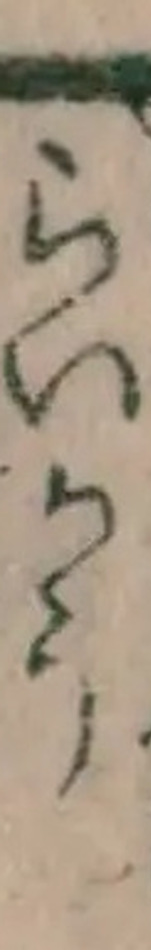らいかう
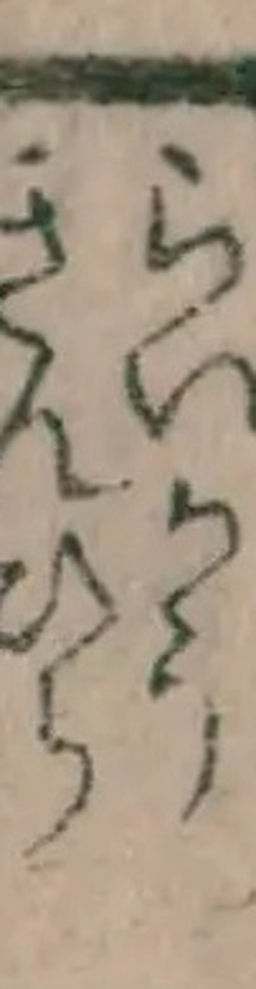きんひら
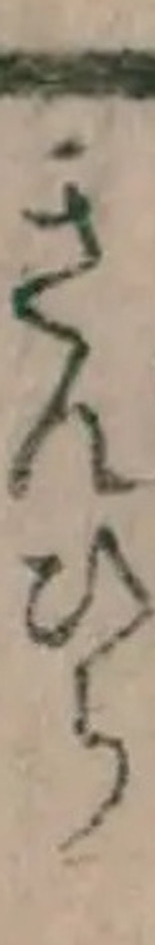きんひら
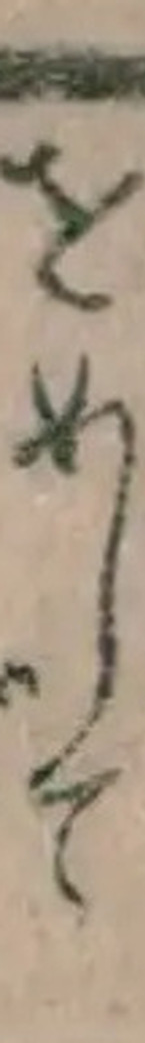をめして
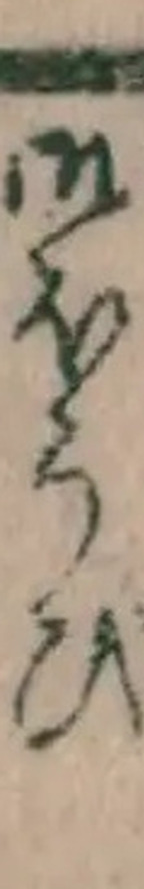御ほうび
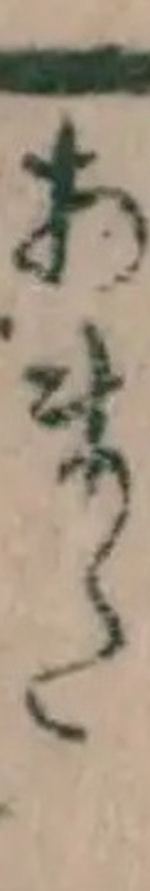あまた
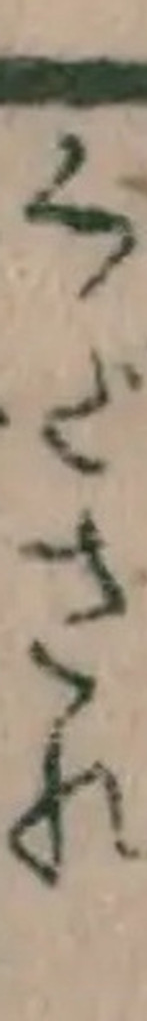くだされ
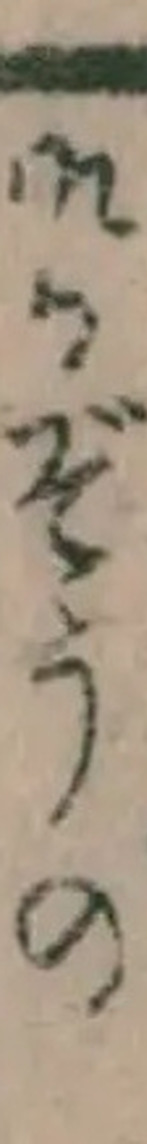御かぞうの
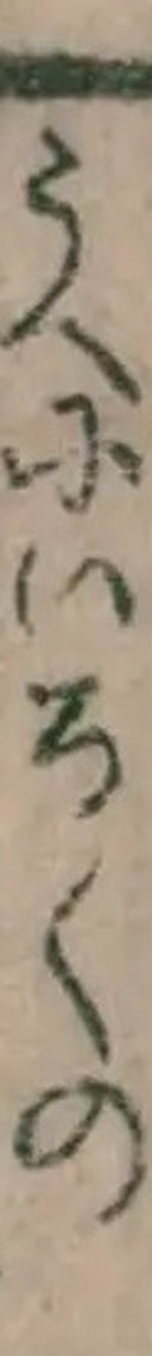うへにいろ〳〵の
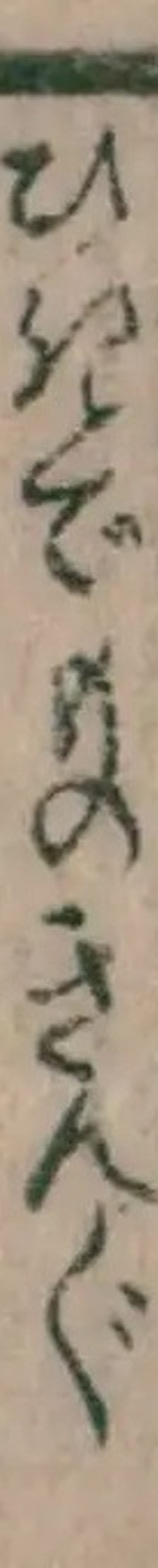ひきでものきん〴〵
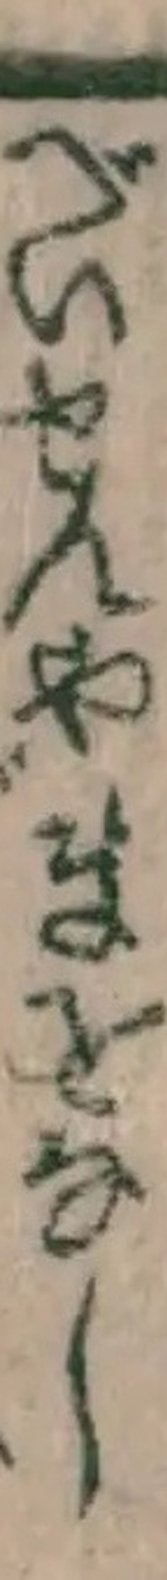べいせんやまをなし
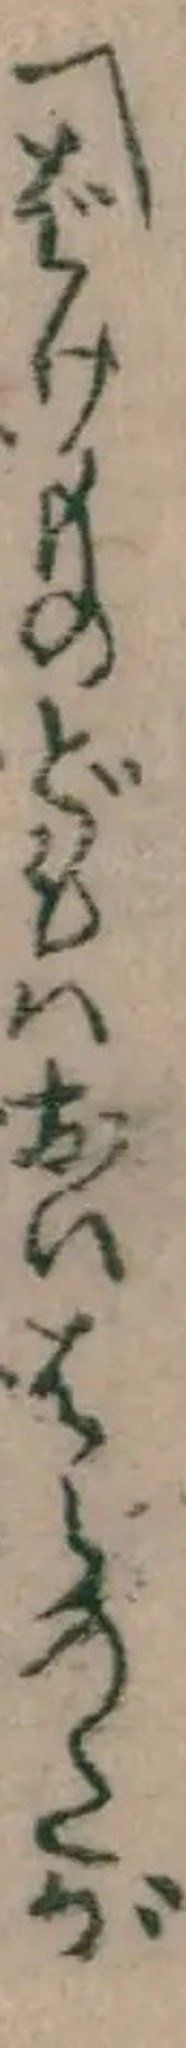〽ばけものどもはおいはらつたが
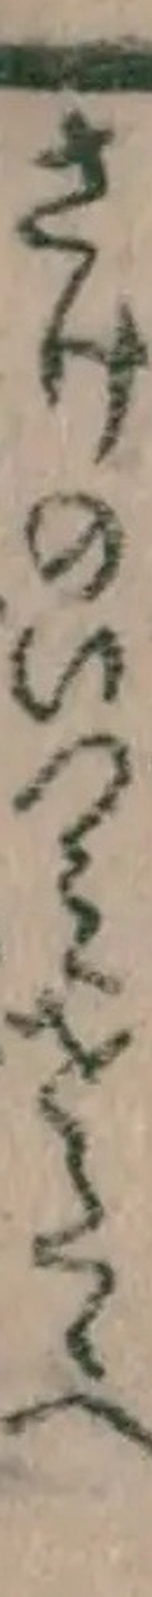さけのいづみをたゝへ
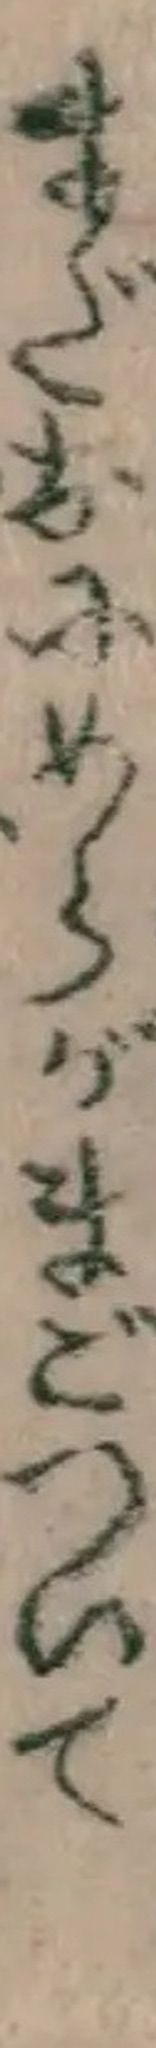まだおにめらがまごついて
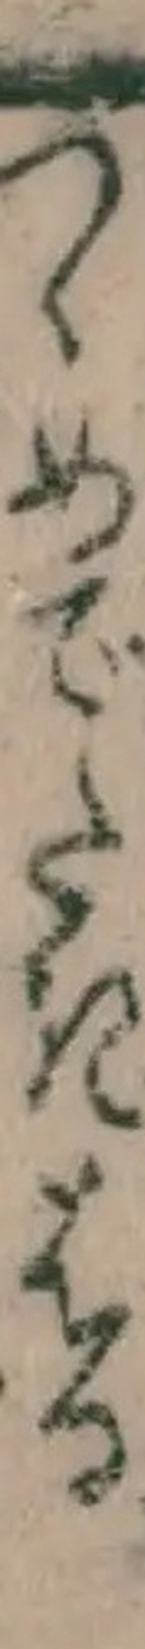つゝめでたきはる
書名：信有奇怪会
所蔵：国立国会図書館 National Diet Library, JAPAN
